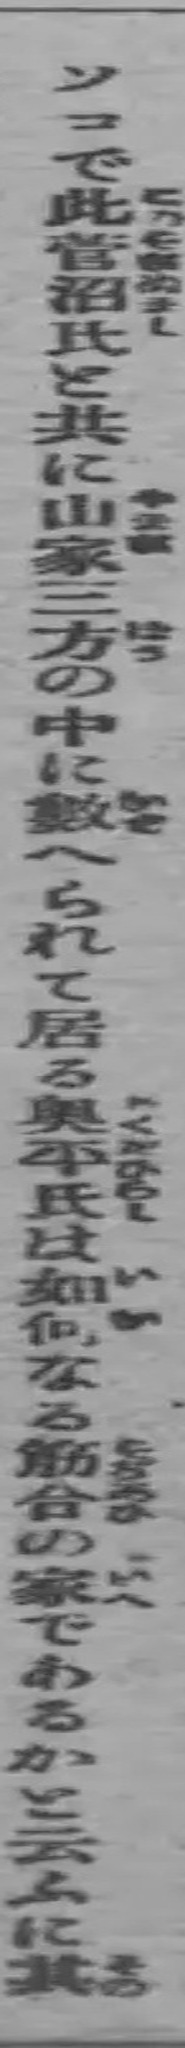奥平氏ソコで此菅沼氏と共に山家三方の中に数へられて居る奥平氏は如何なる筋合の家であるかと云ふに其
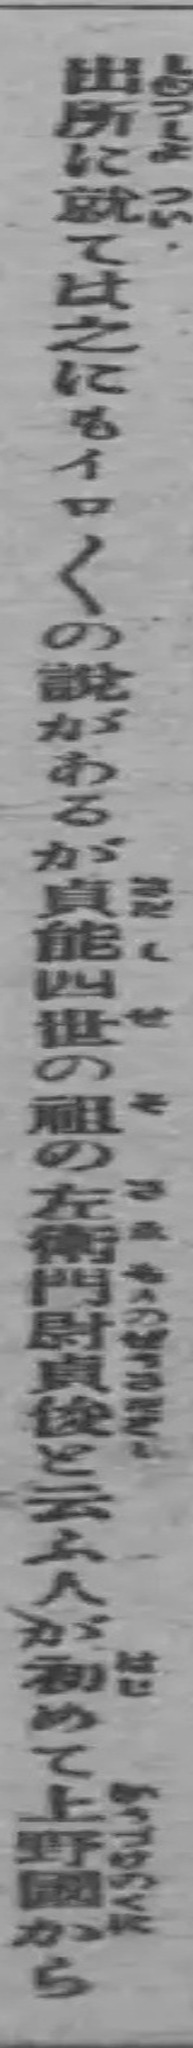出所に就ては之にもイロ〳〵の説があるが貞能四世の祖の左衛門尉貞俊と云ふ人が初めて上野国から
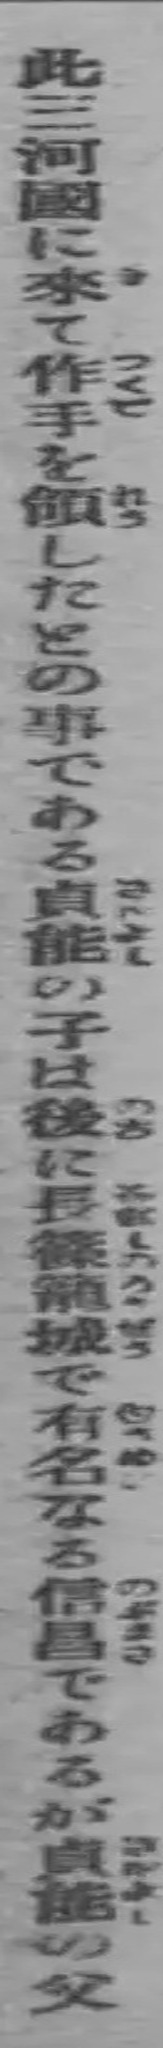此三河国に来て作手を領したとの事である貞能の子は後に長篠籠城で有名なる信昌であるが貞能の父
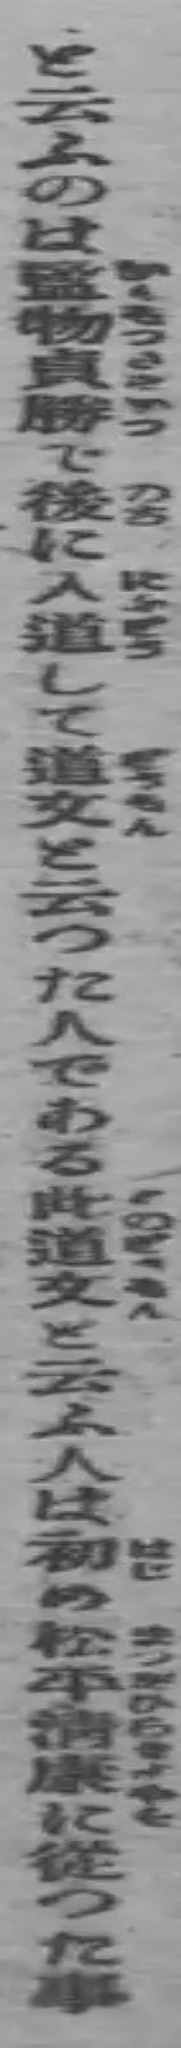と云ふのは監物貞勝で後に入道して道文と云つた人である此道文と云ふ人は初め松平清康に従つた事
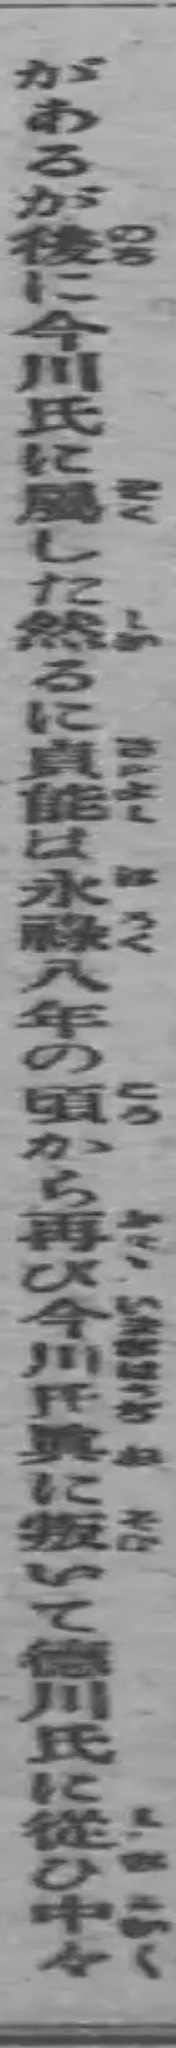があるが後に今川氏に属した然るに貞能は永禄八年の頃から再び今川氏真に叛いて徳川氏に従ひ中々
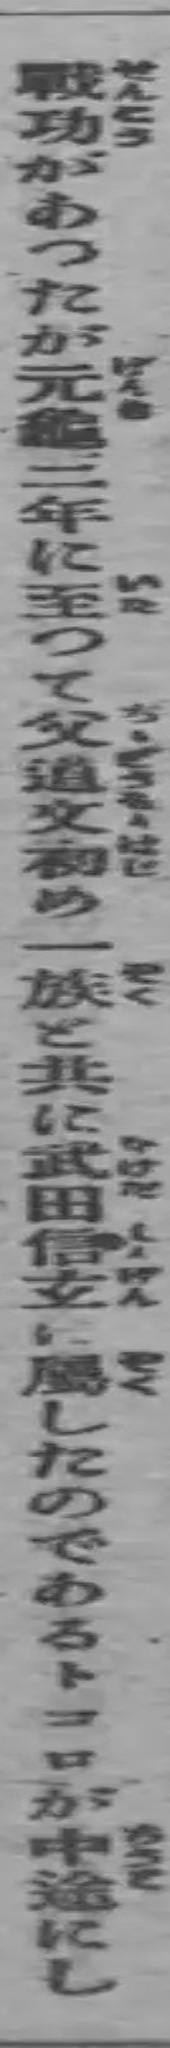戦功があつたが元亀二年に至つて父道文初め一族と共に武田信玄に属したのであるトコロが中途にし
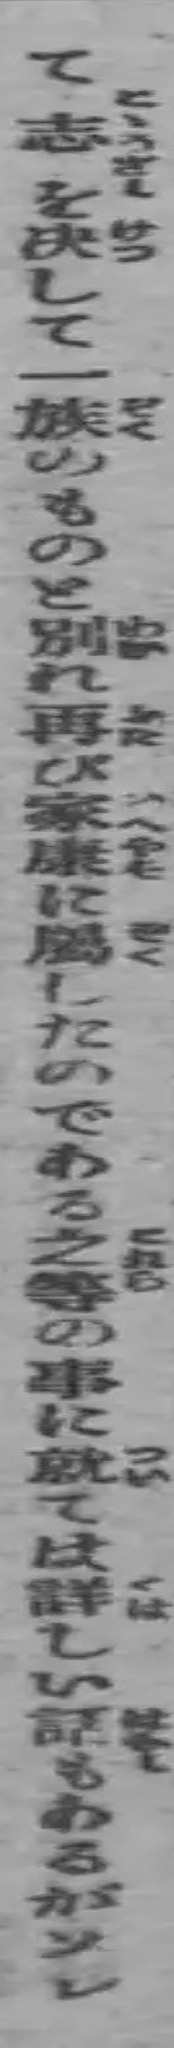て志を決して一族のものと別れ再び家康に属したのである之等の事に就ては詳しい話もあるがソレ
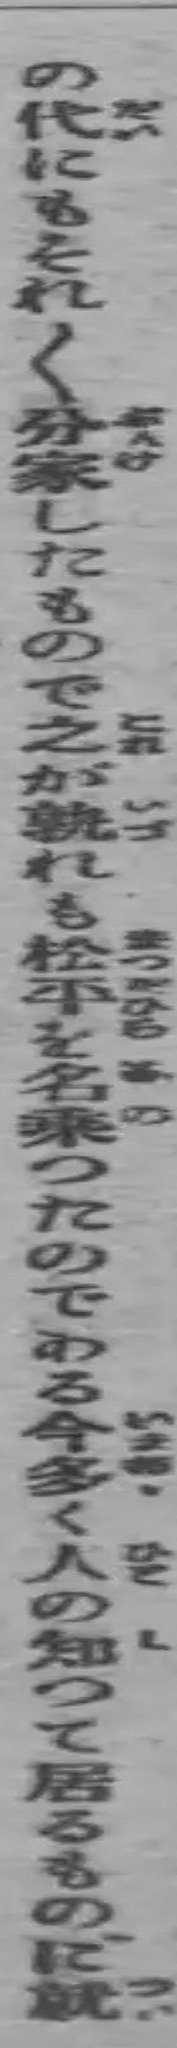の代にもそれ〳〵分家したもので之が孰れも松平を名乗つたのである今多く人の知つて居るものに就
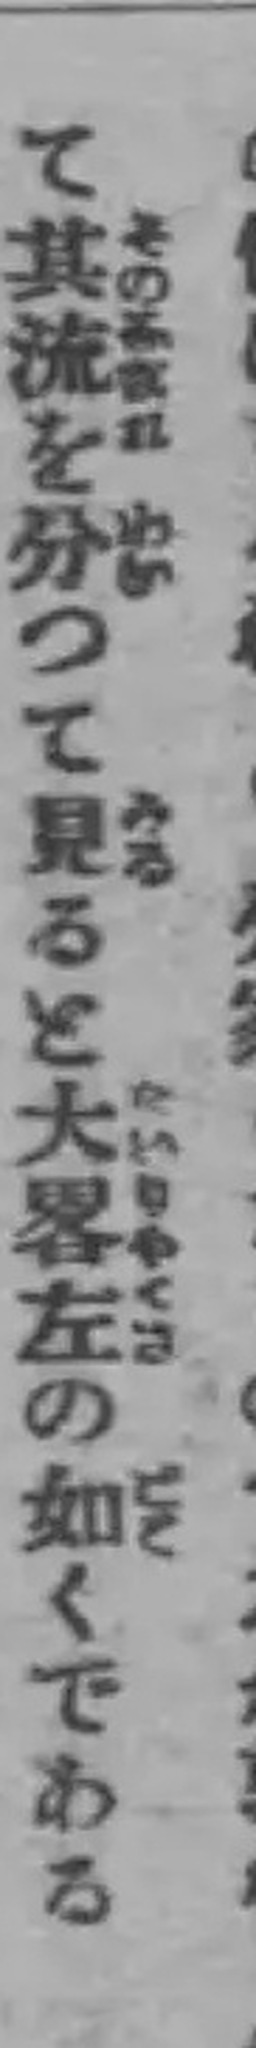て其流を分つて見ると大略左の如くである
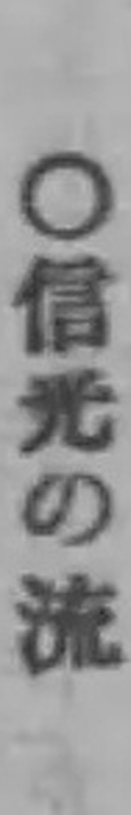〇信光の流
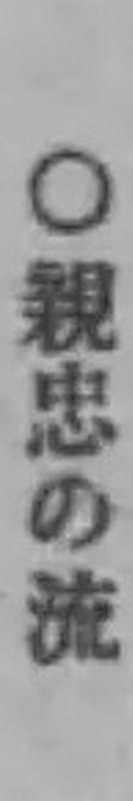〇親忠の流
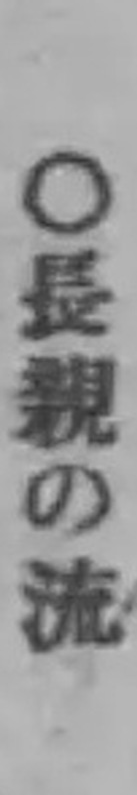〇長親の流
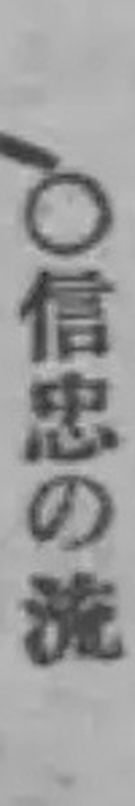〇信忠の流
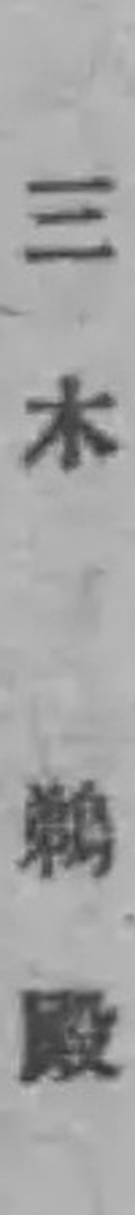三木鵜殿
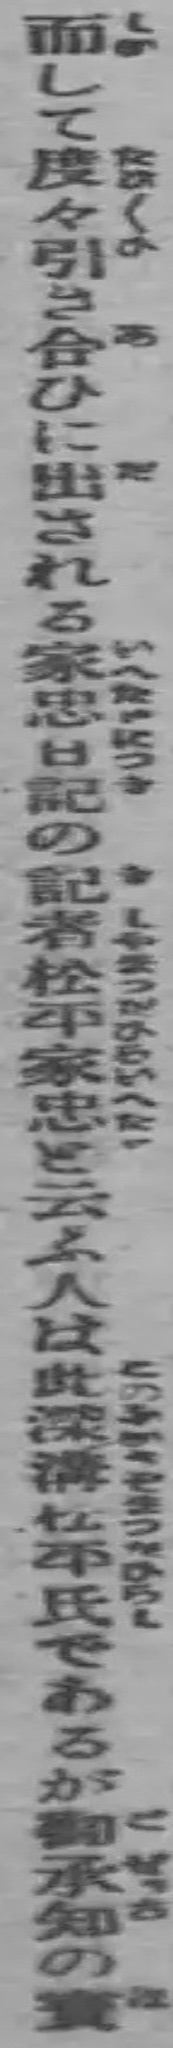而して度々引き合ひに出される家忠日記の記者松平家忠と云ふ人は此深溝松平氏であるが御承知の宝

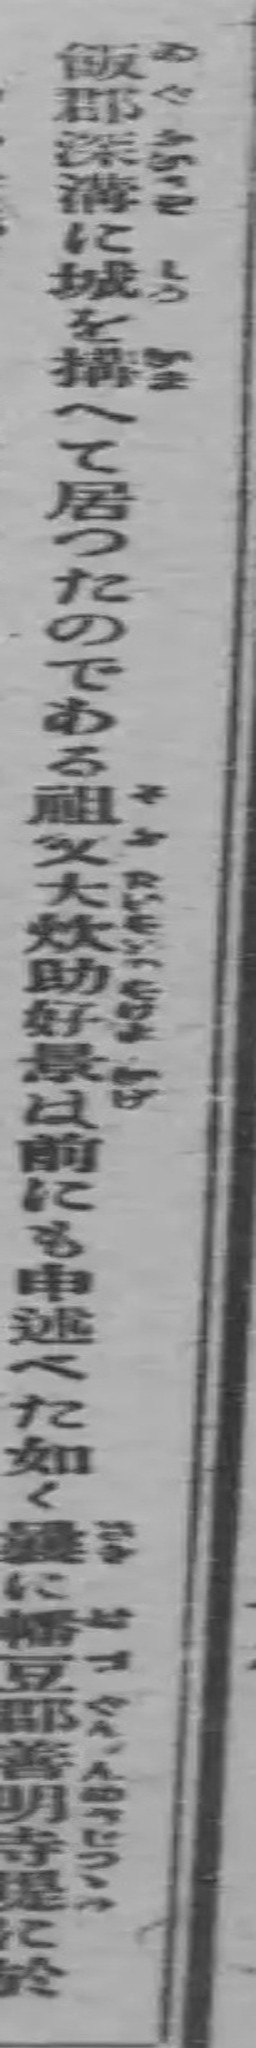飯郡深溝に城を搆へて居つたのである祖父大炊助好景は前にも申述べた如く曩に幡豆郡善明寺堤に於
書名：豊橋市史談
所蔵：国立国会図書館 National Diet Library, JAPAN
